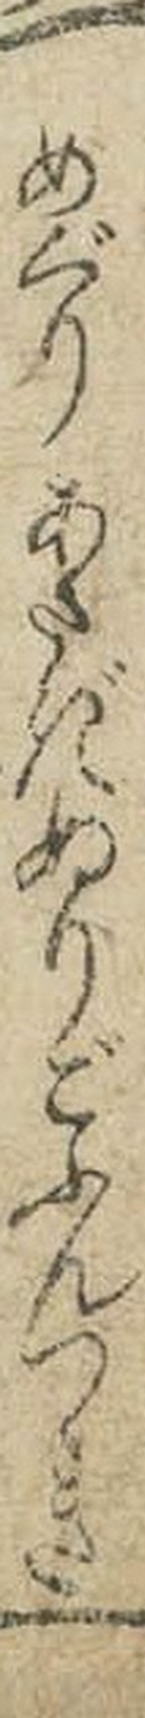めぐりあさぎぬりごふんつゝき
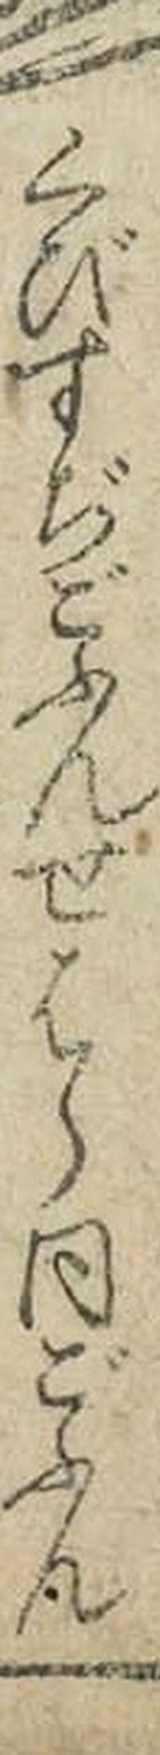くびすぢごふんせはら同ごふん
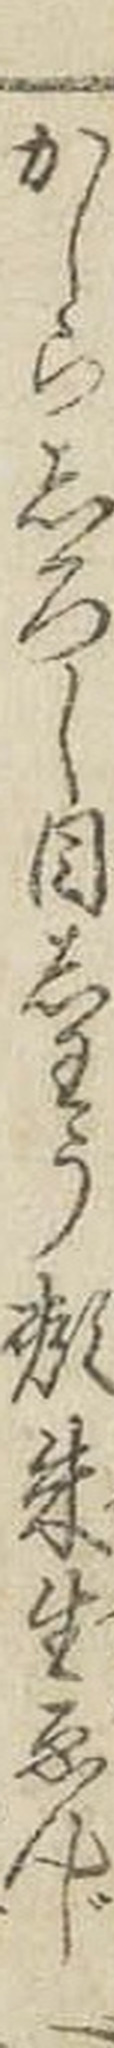かしらしろし目しわう頬朱生ゑんじ
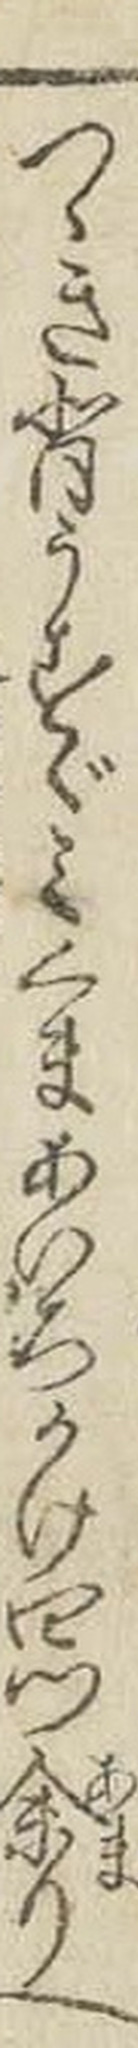つゝき背うすゞみくまあいろかけ四ツ余り
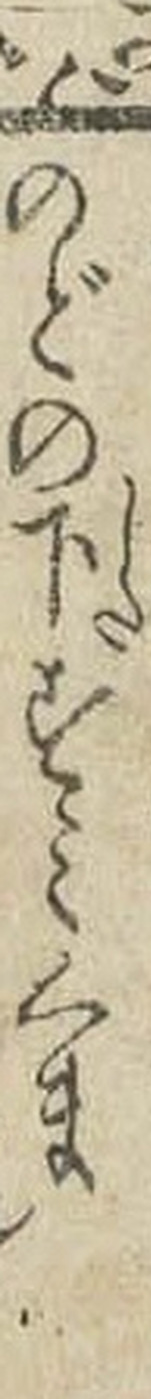のどの下すみくま
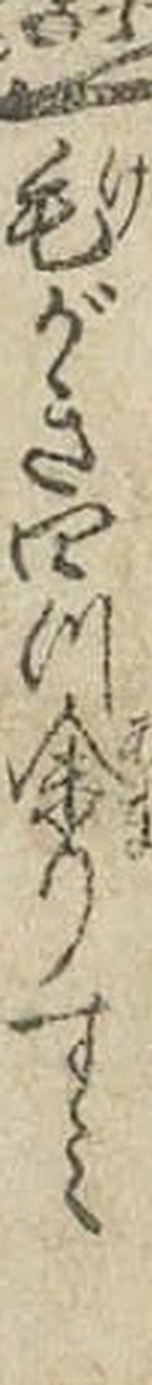毛がき四つ余りすみ
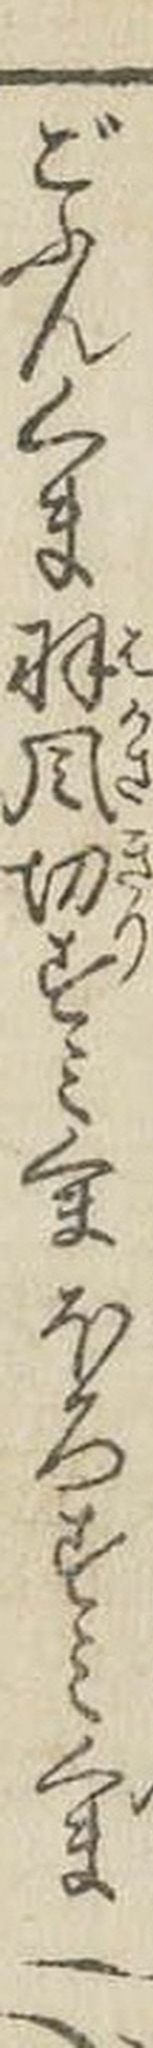ごふんくま羽風切すみくまほろすみくま
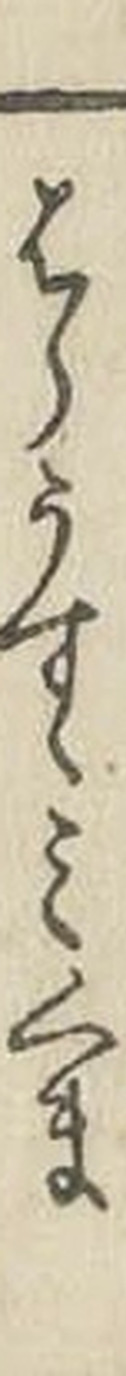はらうすゝみくま
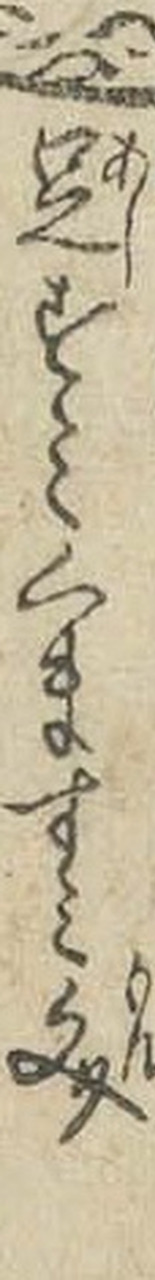足すみくますみ文
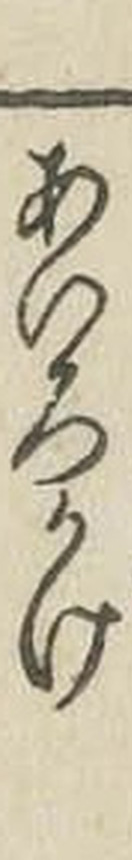あいろかけ
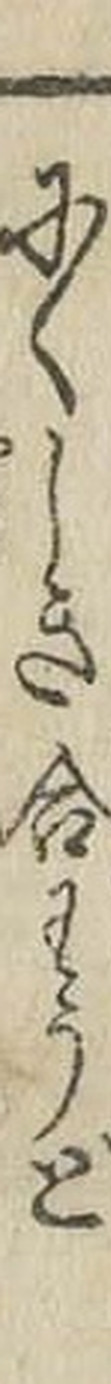にくしき合わうど
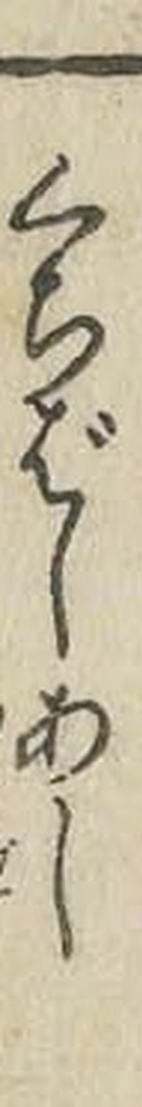くちばしあし
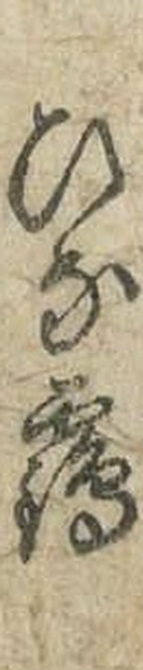ひな鶴
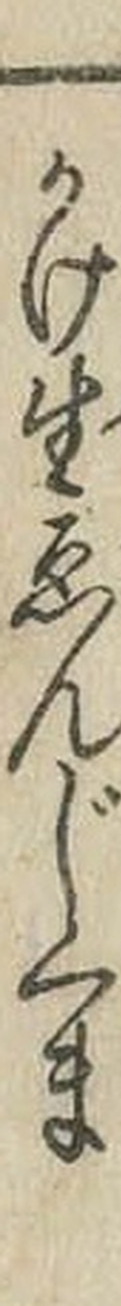かけ生ゑんじくま

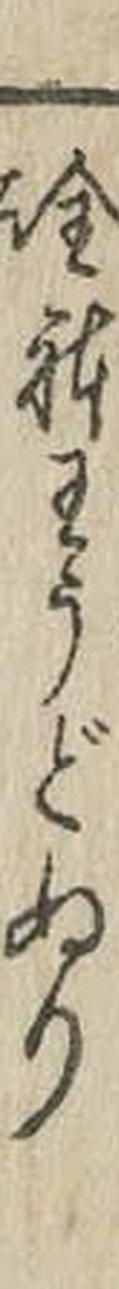全体わうどぬり
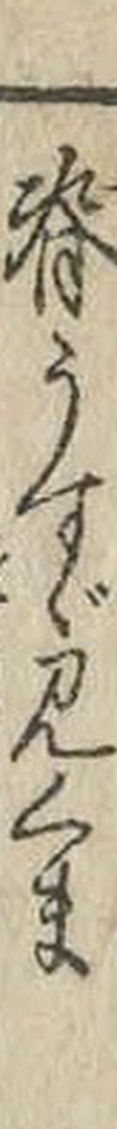脊うすゞみくま
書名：絵本写宝袋 9巻 8之巻
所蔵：東京学芸大学教育コンテンツアーカイブ
